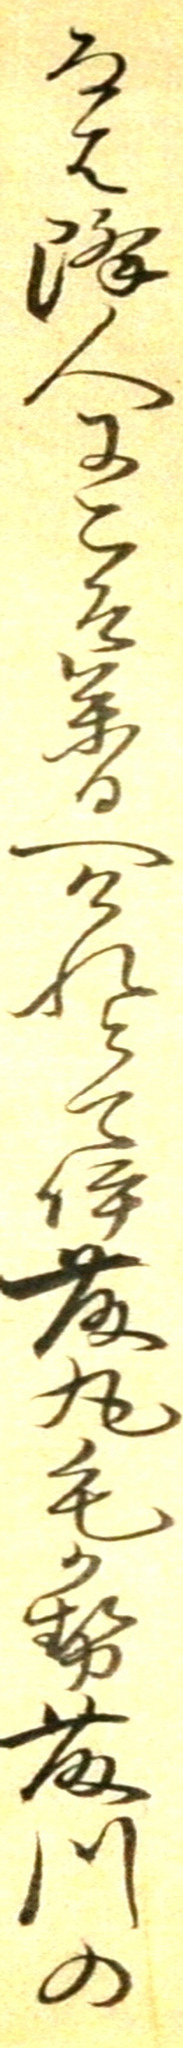なは降人にこそ参るへけれとて伊藤丸毛か勢藤川の
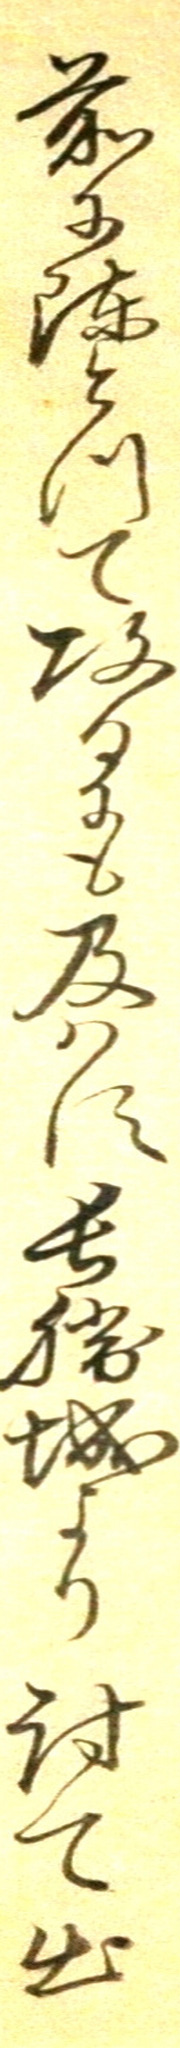前に陣とつて攻るにも及はす長勝城より討て出
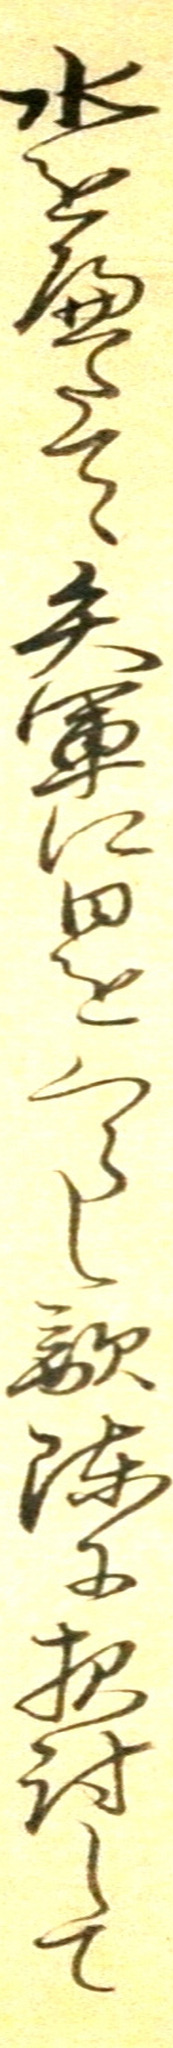水をへたてゝ矢軍に日をくらし敵陣に夜討して
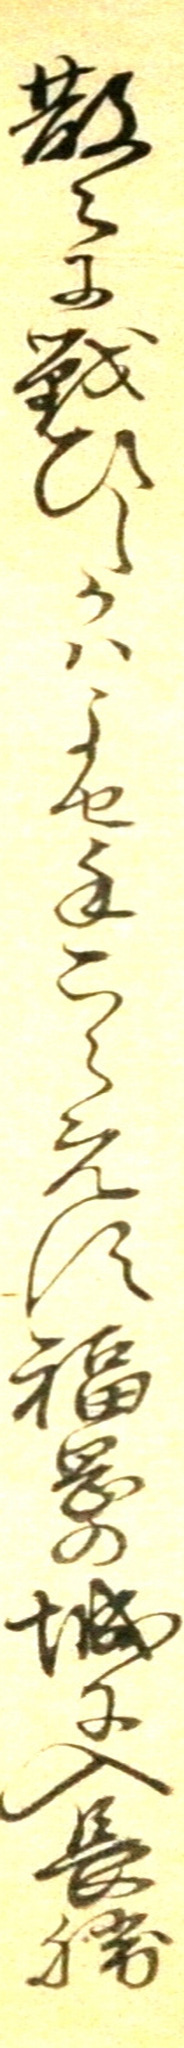散々に戦ひしかはよせ手こらえす福岡の城に入長勝
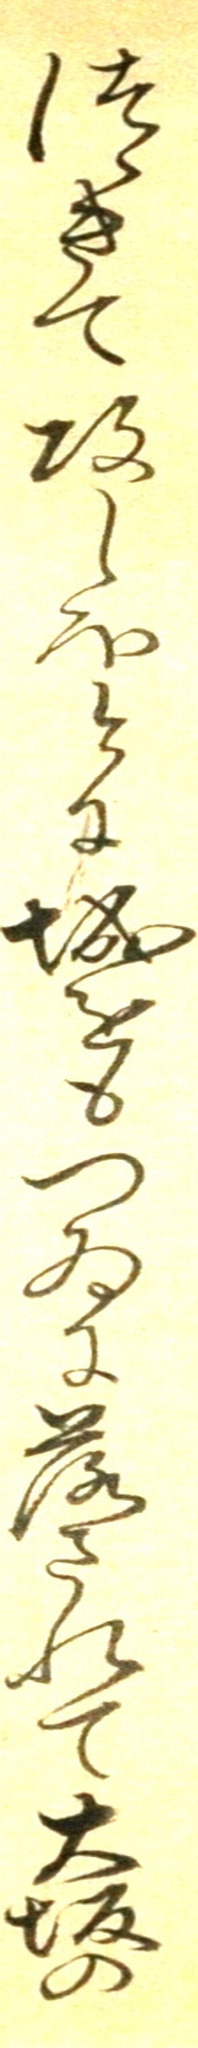つゝきて攻しほとに城をもつゐに落されて大坂の
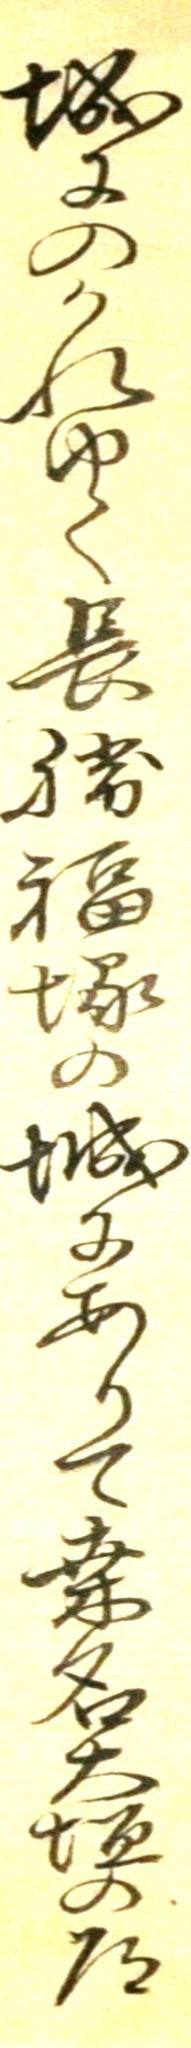城にのかれゆく長勝福塚の城にありて桑名大垣の道
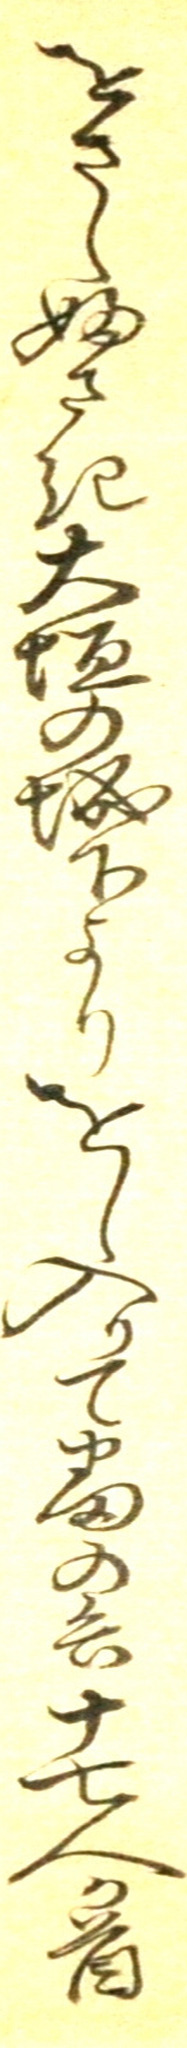をさしふさき大垣の城下よりをし入りて番の兵十七人か首
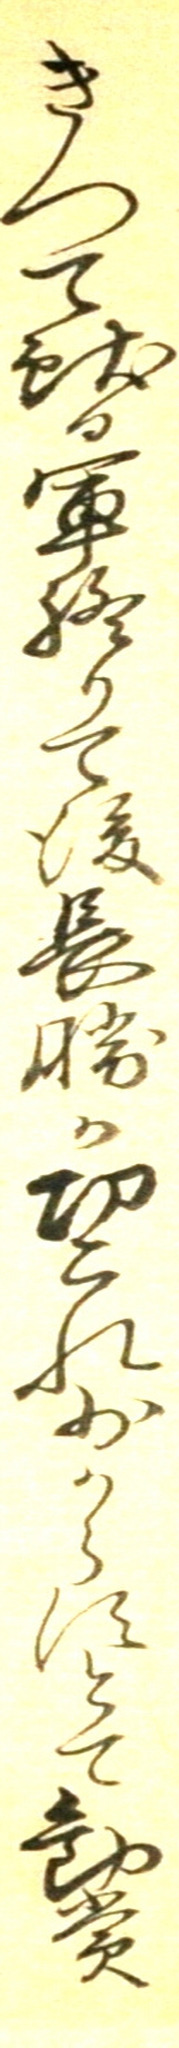きつて献る軍終りて後長勝か功これ少からすとて勧賞
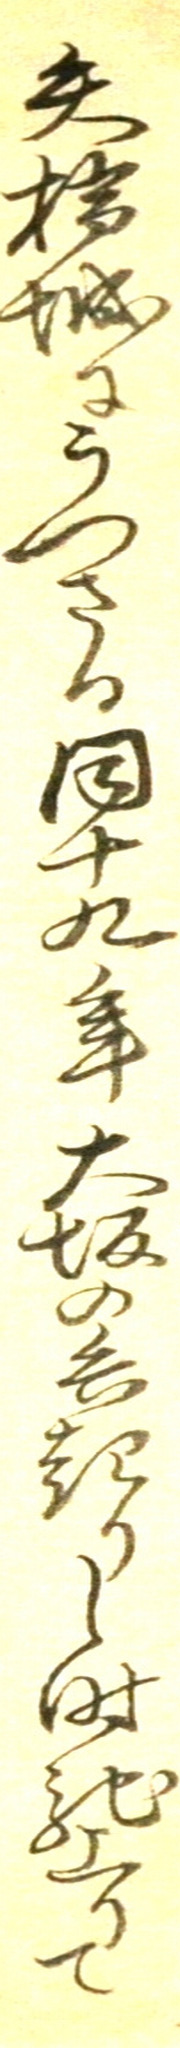矢橋城にうつさる同十九年大坂の兵起りし時馳上りて
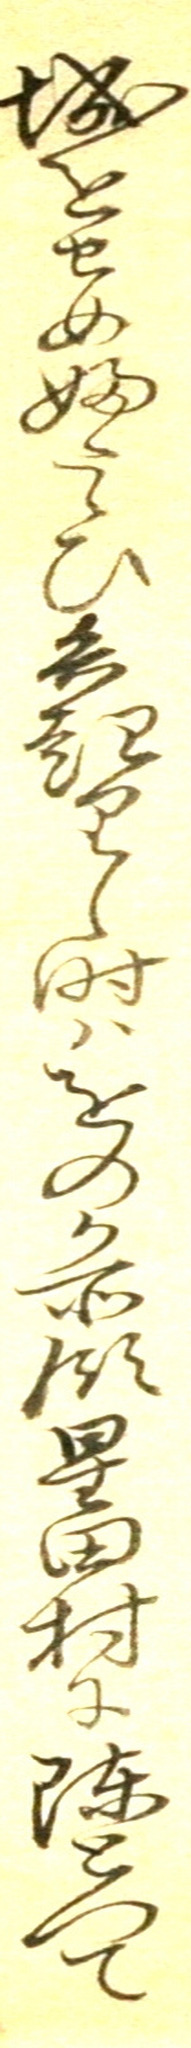城をせめふたゝひ兵起りし時はをのか所領星田村に陣とつて
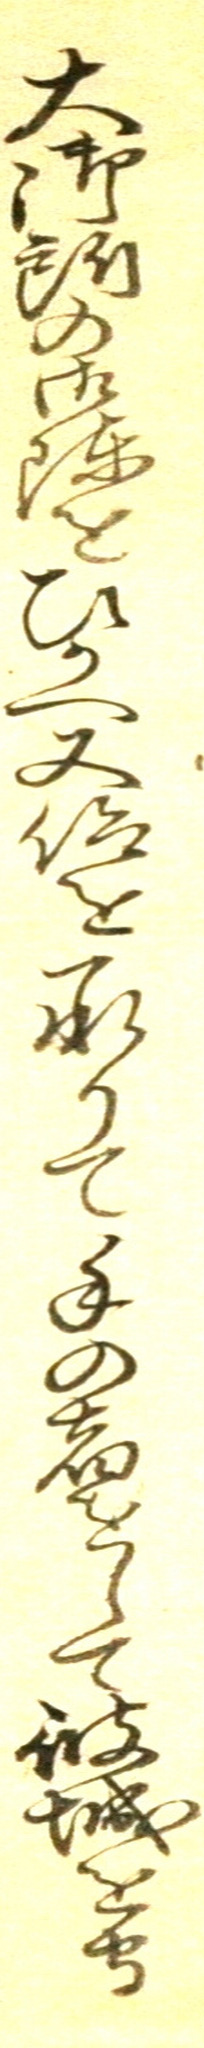大御所の御陣をひかへ又仰を承りて手の者をして彼城を守
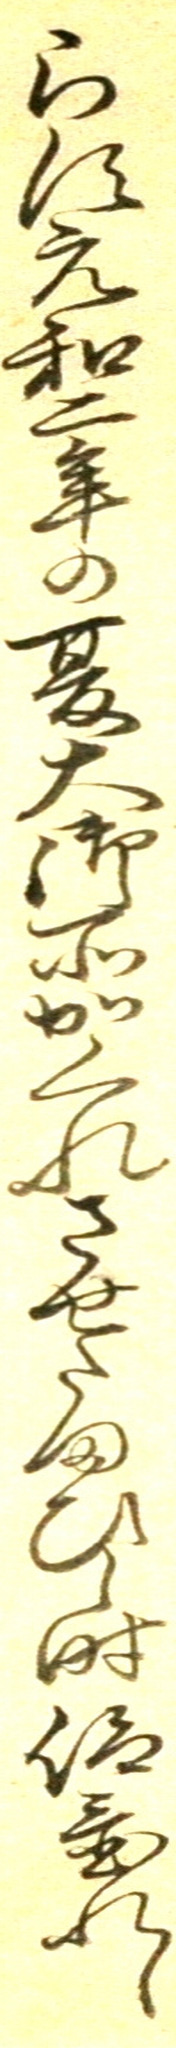らす元和二年の夏大御所かくれさせたまひし時仰置れし
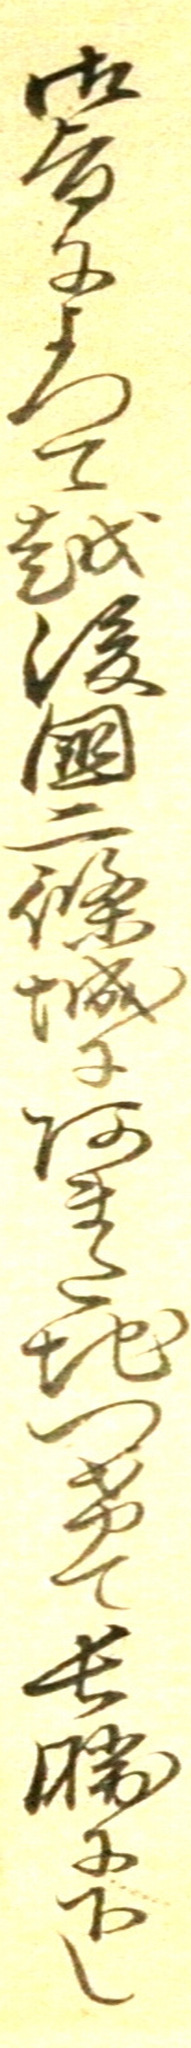御旨によつて越後国二条城にあまた地つけて長勝に下し
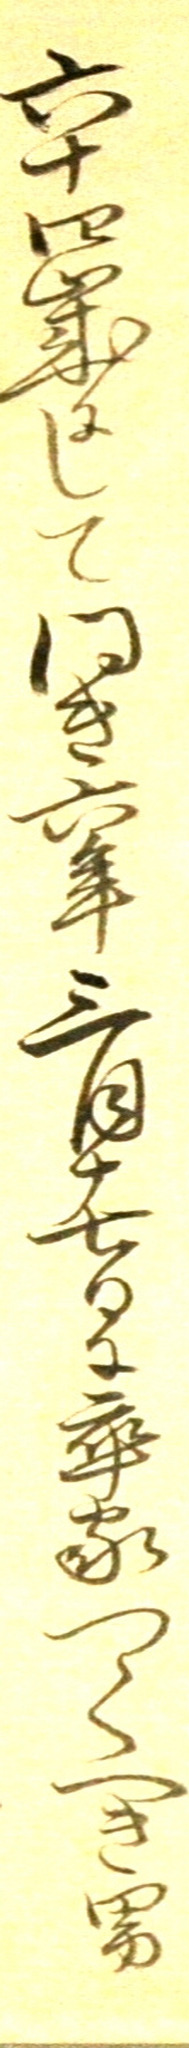六十四歳にして同き六年三月十七日に卒家をつくへき男

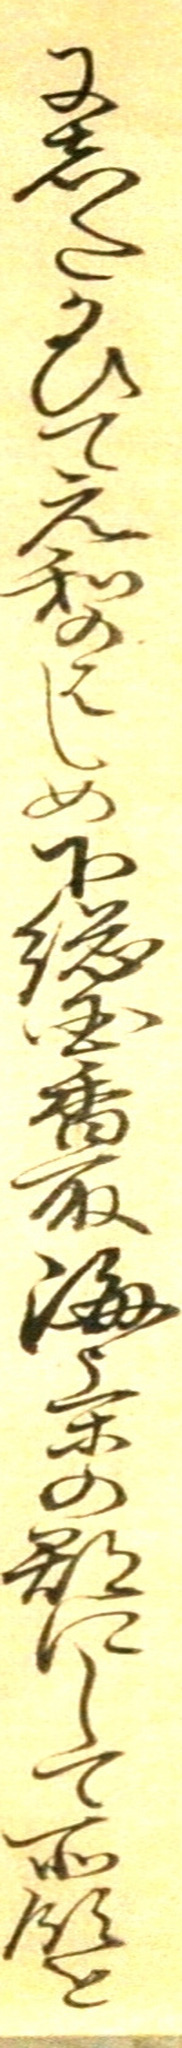にしたかひて元和のはしめ下総国香取海上等の郡にして所領を
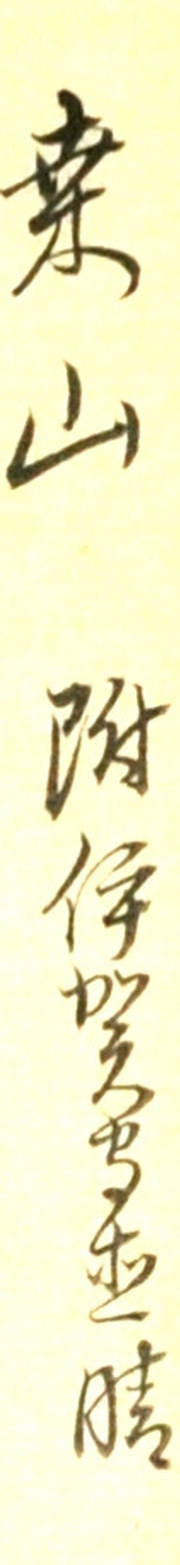桑山付伊賀守直晴
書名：藩翰譜（九・上）
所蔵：伊那市立高遠町図書館・合同会社AMANE
